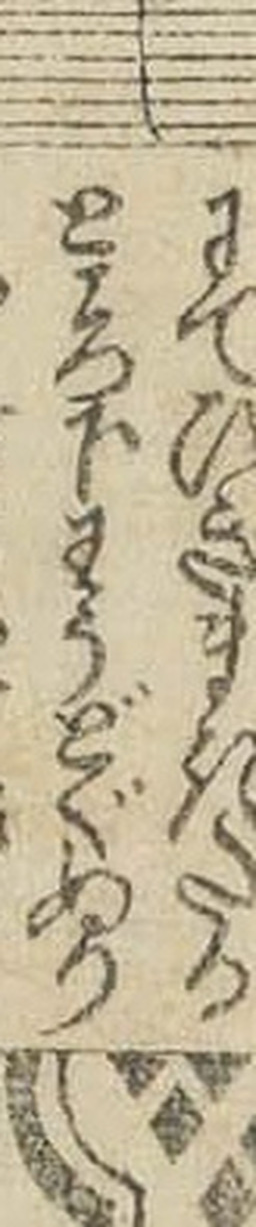ところ下わうどぐぬり
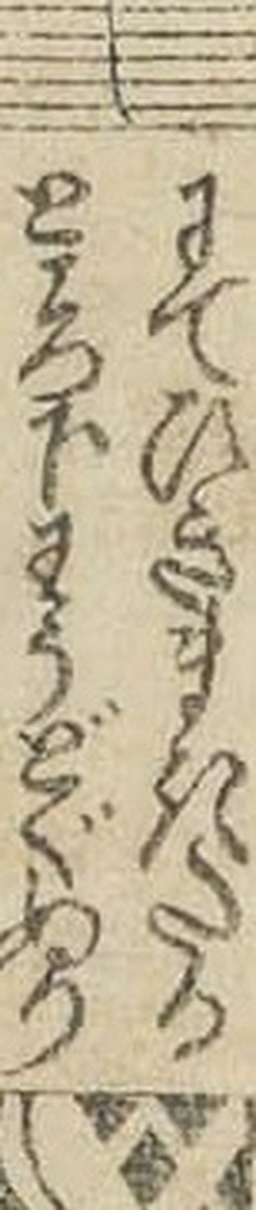ところ下わうどぐぬり
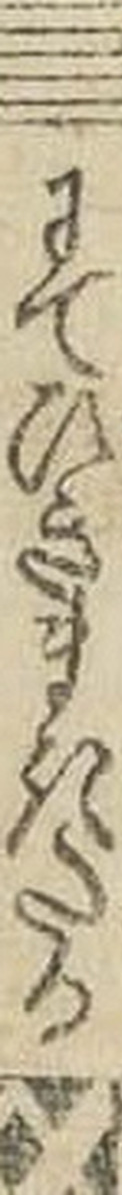にてひきまきたる
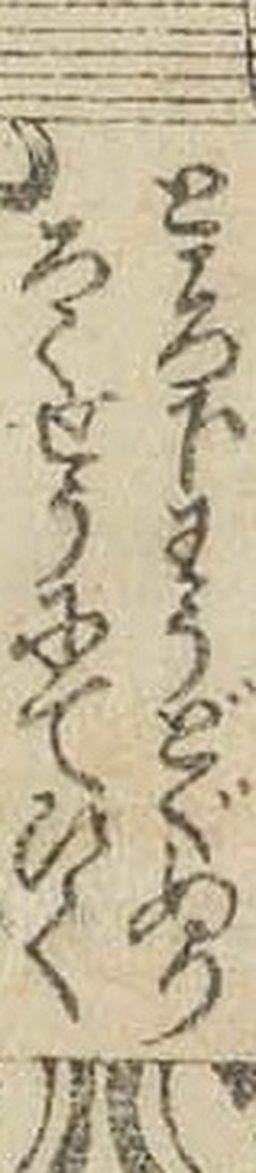ろくせうにてひく
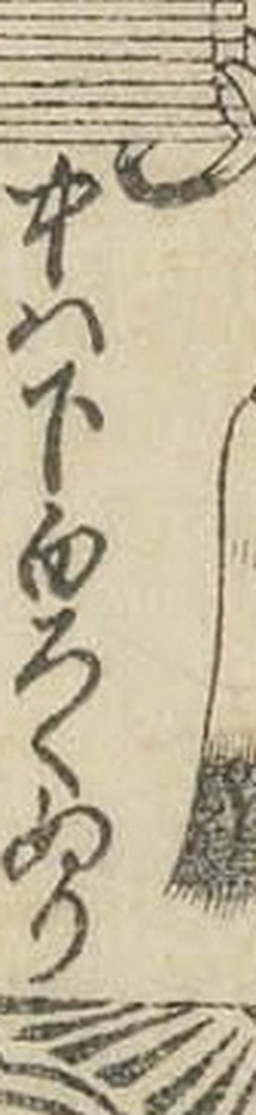中は下白ろくぬり
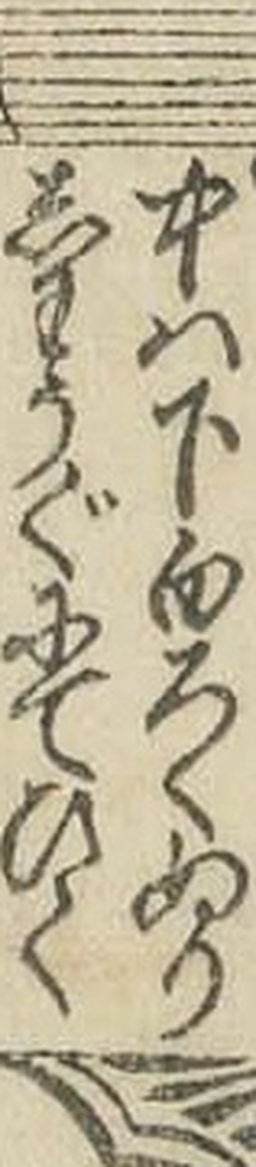しわうぐにてひく
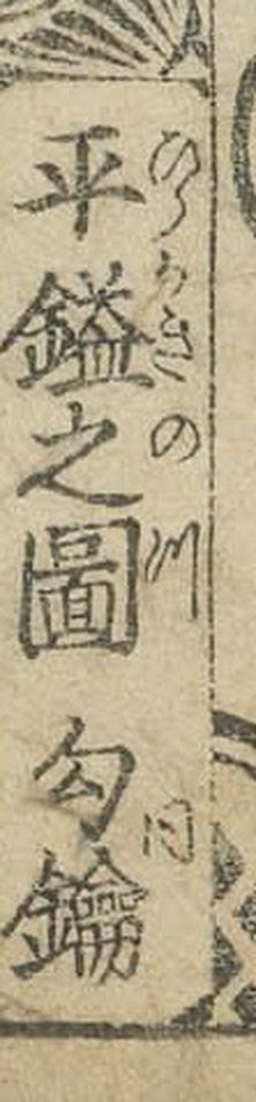平鎰之図勾鑰
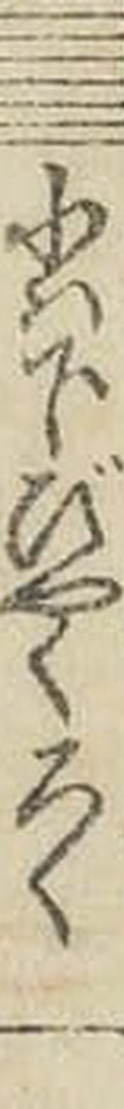小は下びやくろく
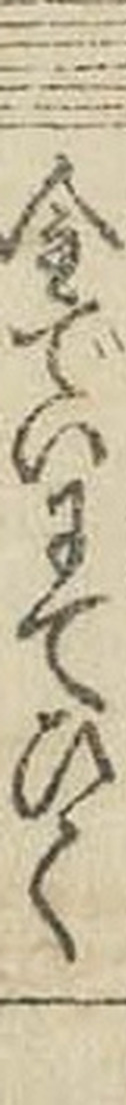金でいにてひく
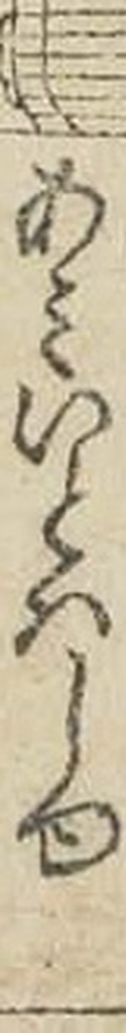あみいとはしゆ
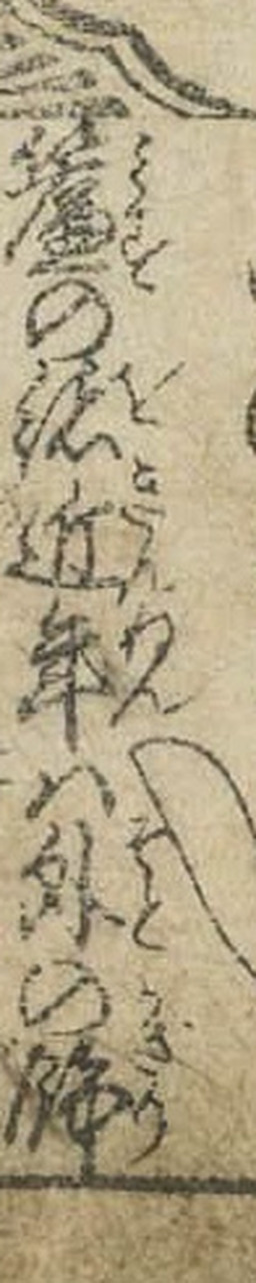簾の緒近年は外の飾
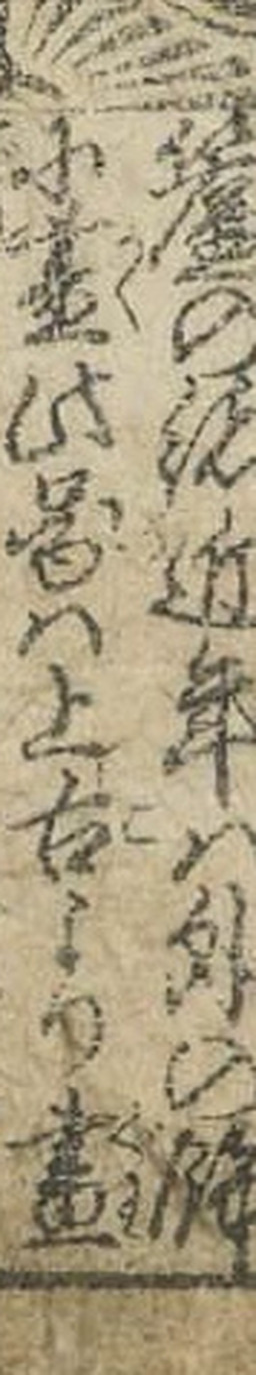に畫此図は上古より畫
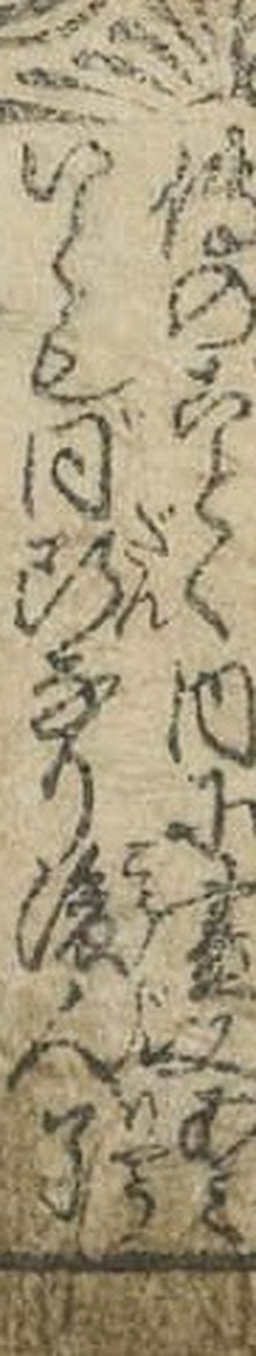いとも同断なり後人了
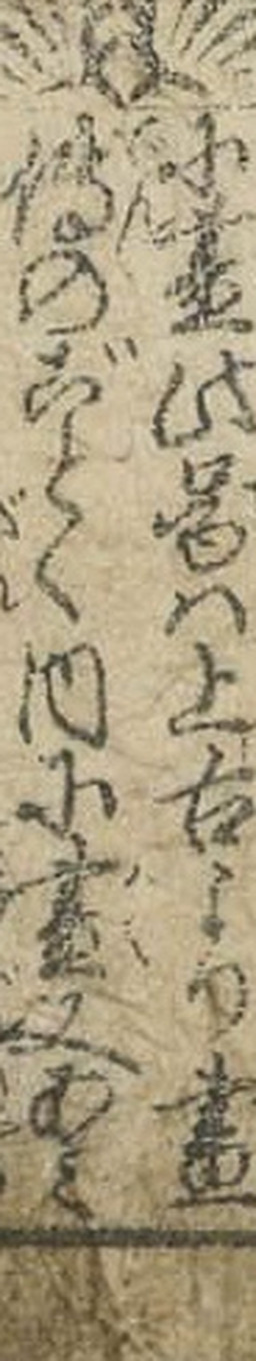伝のごとく内に畫又あみ
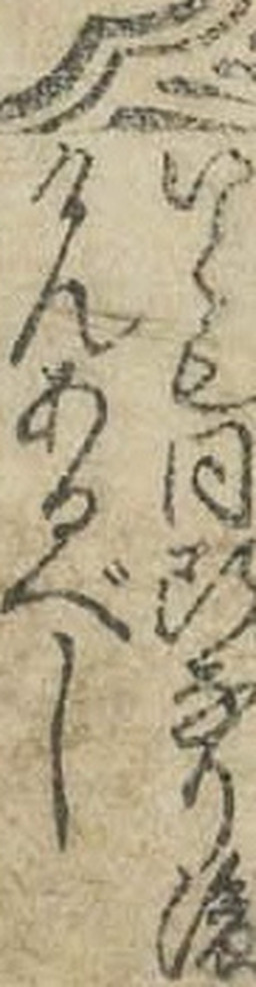けんあるべし
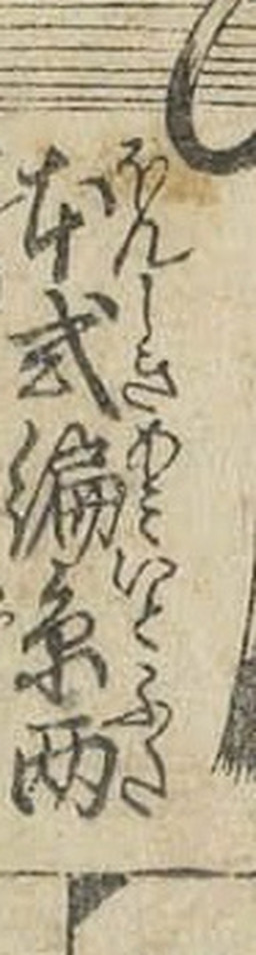本式編糸両
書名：絵本写宝袋 9巻 1之巻
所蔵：東京学芸大学教育コンテンツアーカイブ
